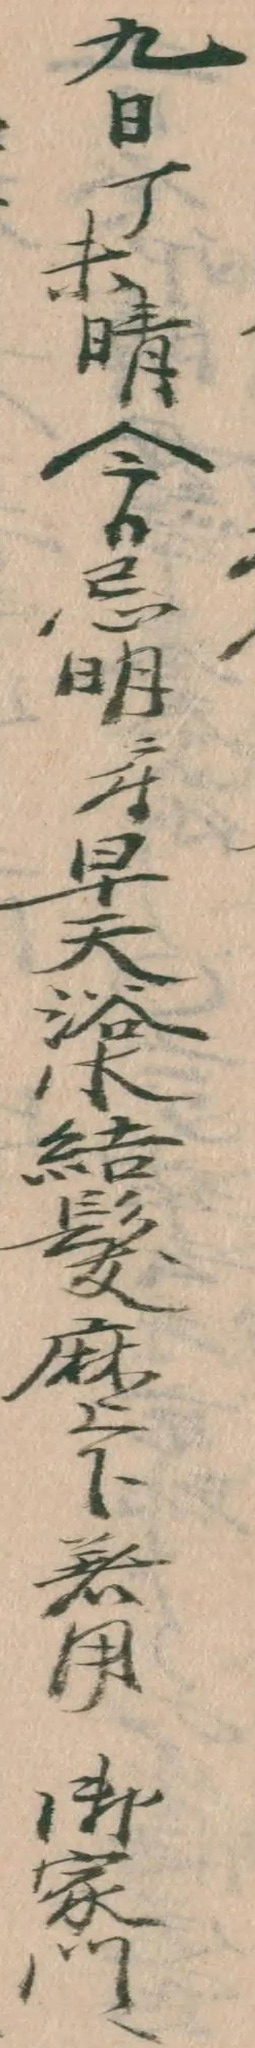九日丁未晴今日忌明ニ付早天浴水結髪麻上下着用御家門ヘ
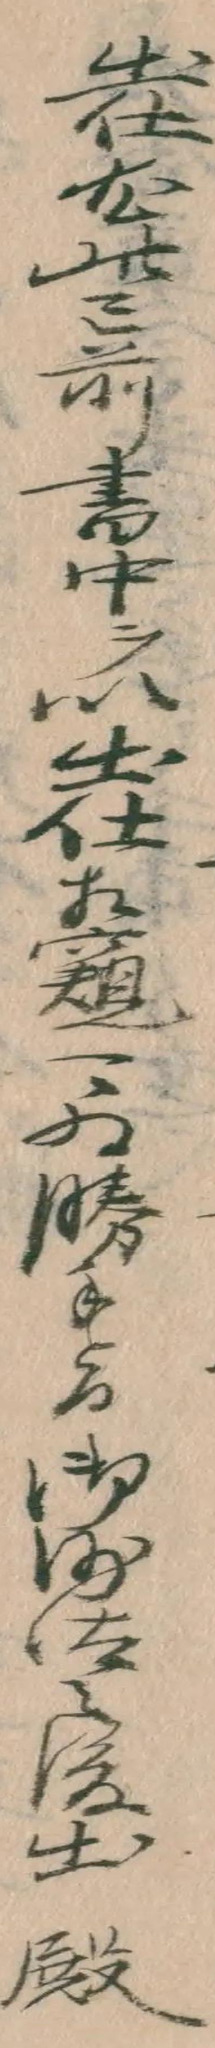出仕尤此已前書中ヲ以出仕相窺可為勝手旨御沙汰之後出殿
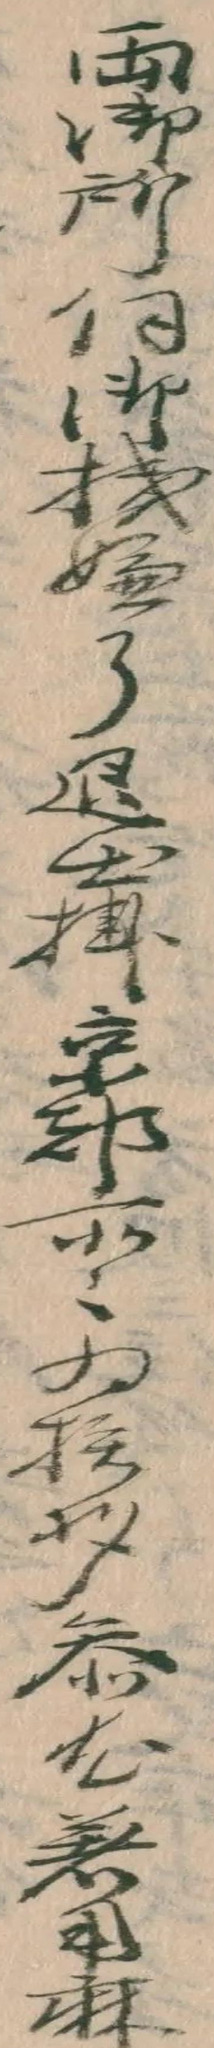両御所伺御機嫌了退出掛京都所々為挨拶参尤着用麻
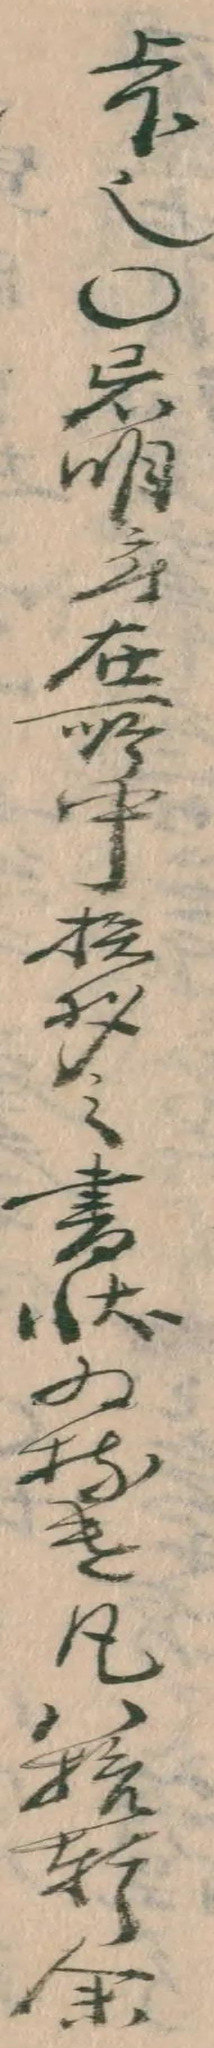上下也○忌明ニ月在所中挨拶之書状為持遣凡八拾軒余
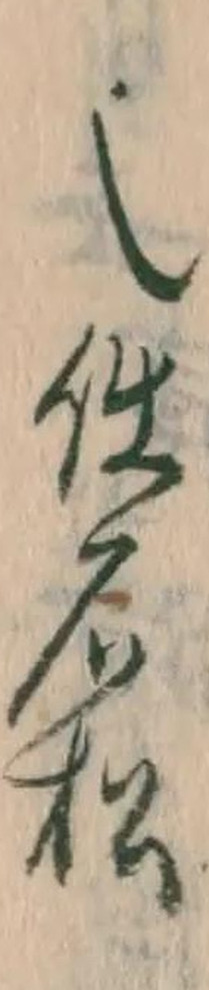也使石松
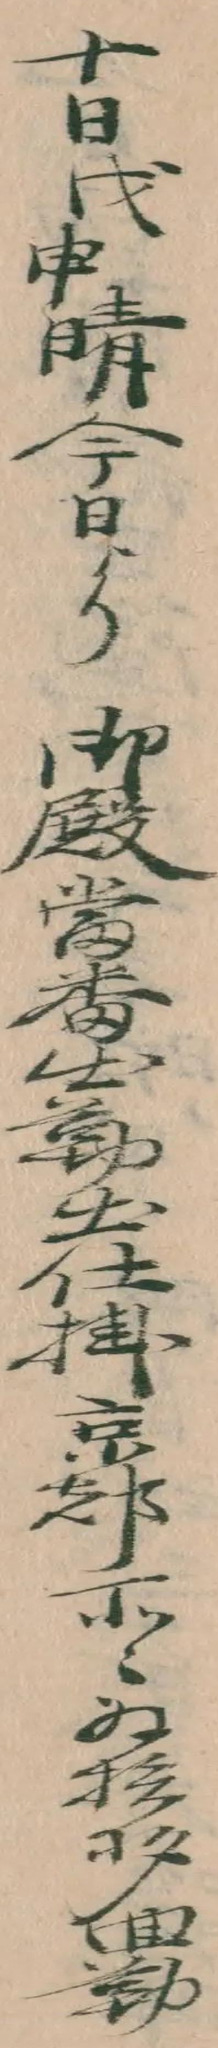十日戊申晴今日より御殿當番出勤出仕掛京都所々為挨拶回勤
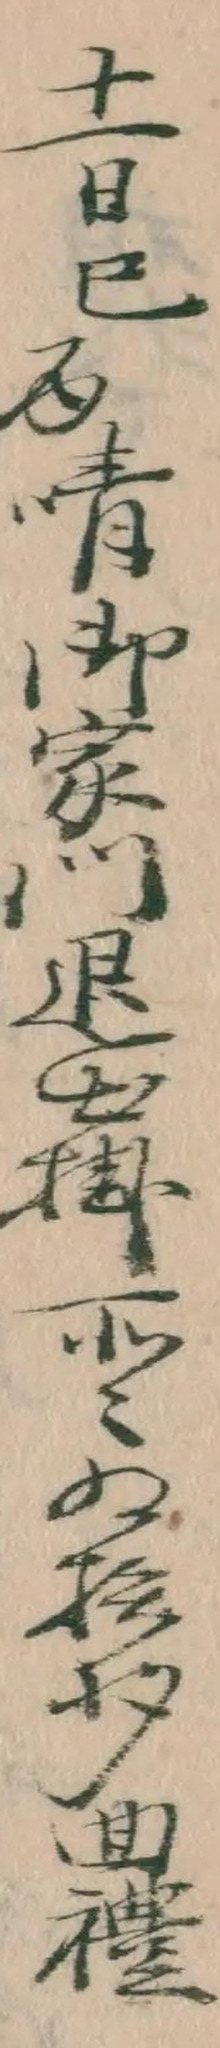十一日己酉晴御家門退出掛所々為挨拶回禮
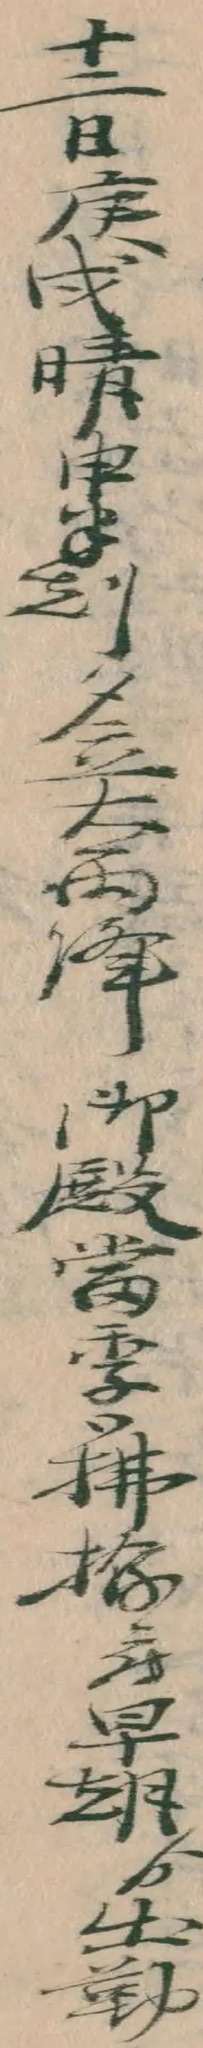十二日庚戌晴申半刻夕立大雨降御殿當季御払拵ニ付早朝ゟ出勤
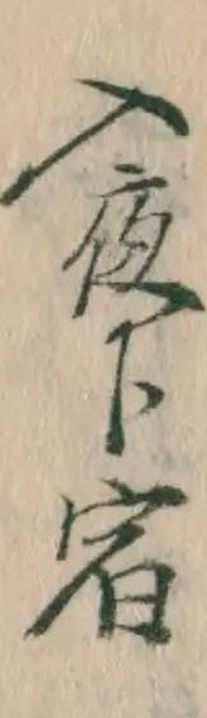入夜下宿
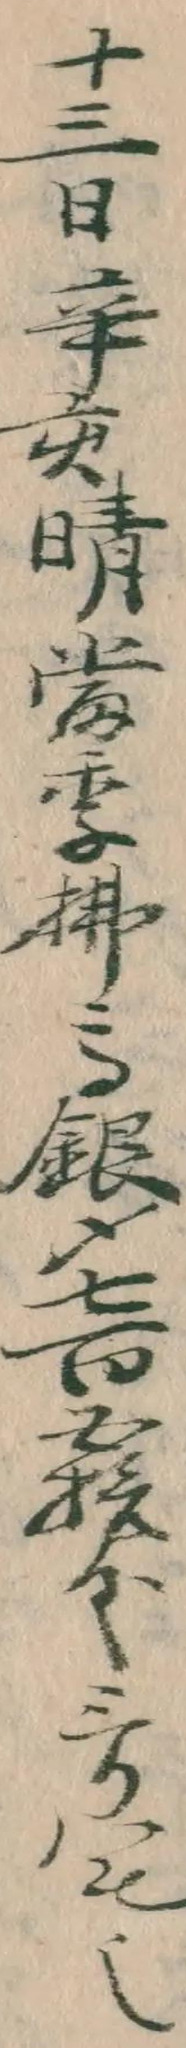十三日辛亥晴當季払高銀〆七百五拾匁三り宛也
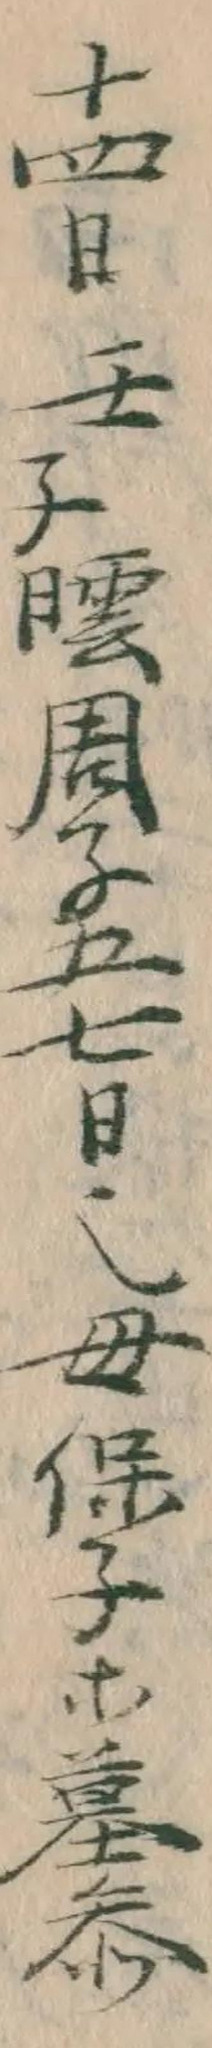十四日壬子曇周子五七日也母保子等墓参
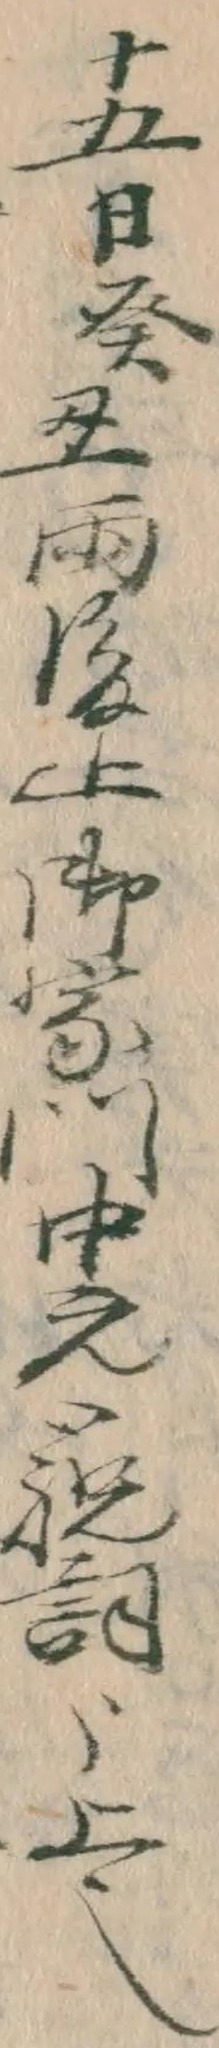十五日癸丑雨後止御家門中元御祝詞申上也
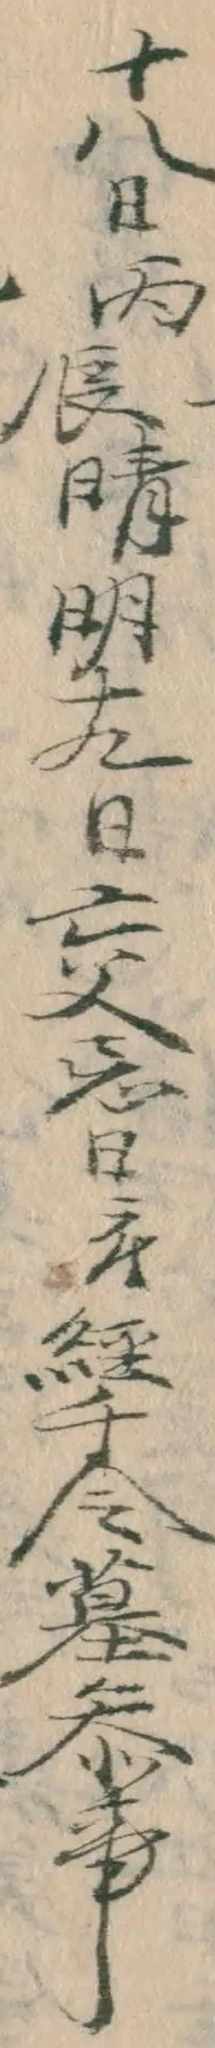十八日丙辰晴明十九日亡父忌日ニ付経千令墓参事
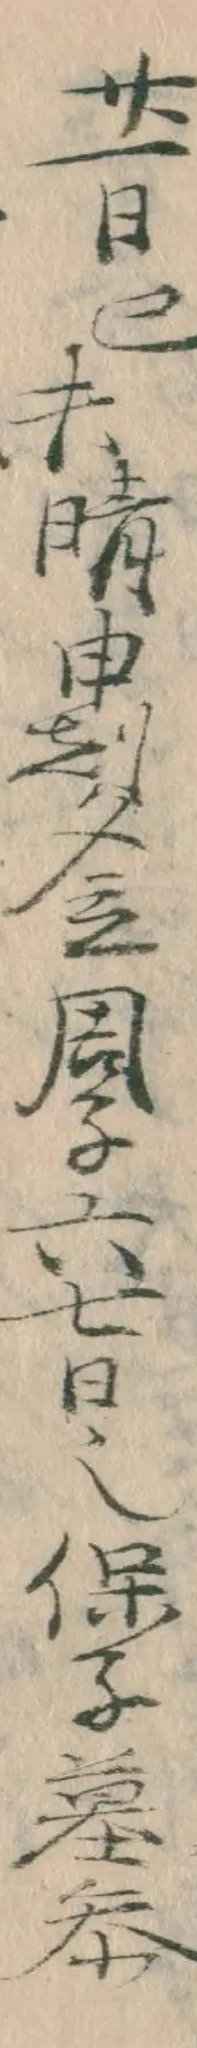廿一日己未晴申刻夕立周子六七日也保子墓参
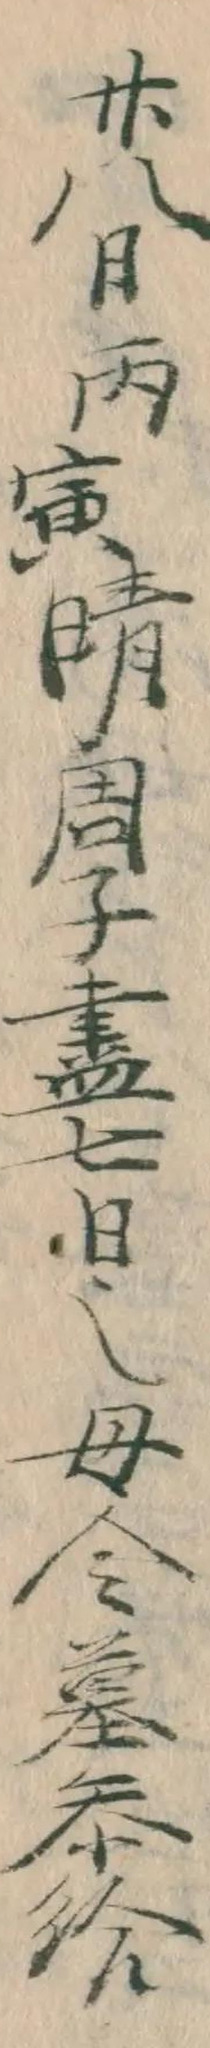廿八日丙寅晴周子盡七日也母令墓参給

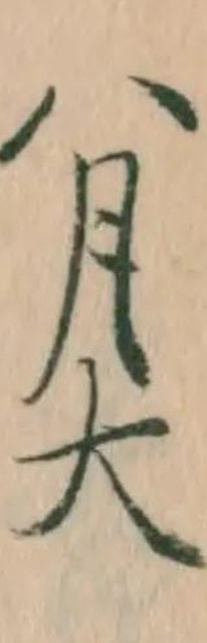八月大
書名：賀茂社記録. 第65冊
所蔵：国立国会図書館 National Diet Library, JAPAN
